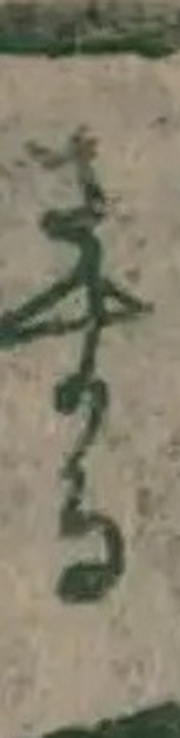さする
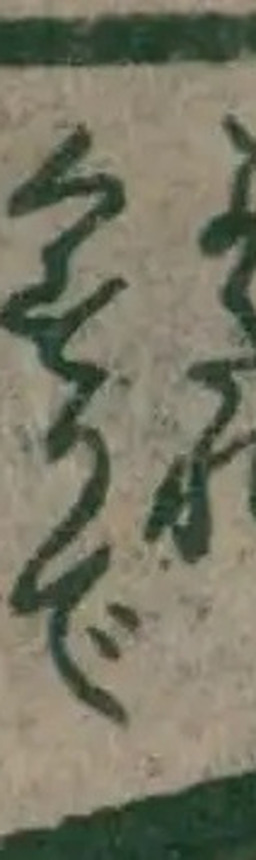くすりで
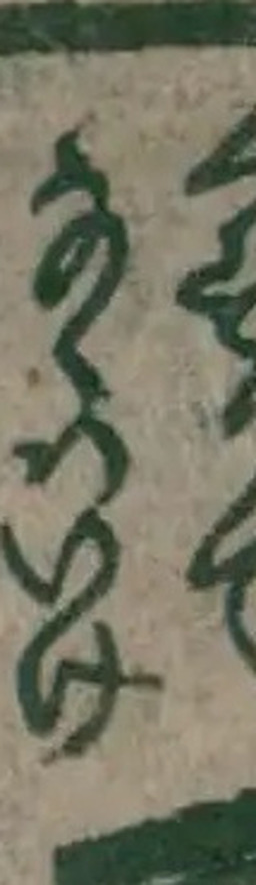なくはいけ
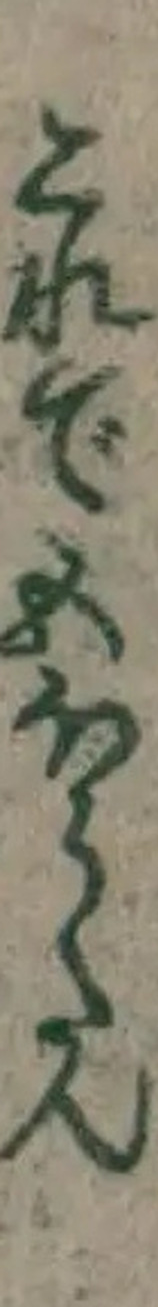これで五ほうたん
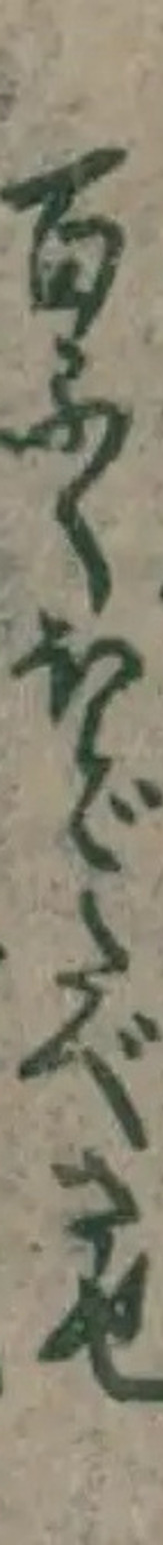百ふうほどたべさせ

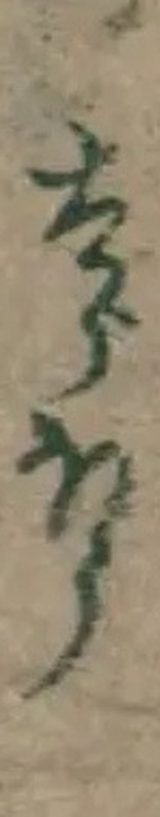太らほう
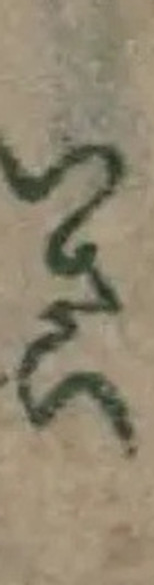いさい
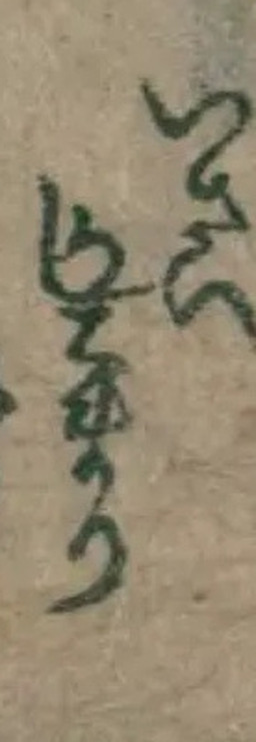かしこまり
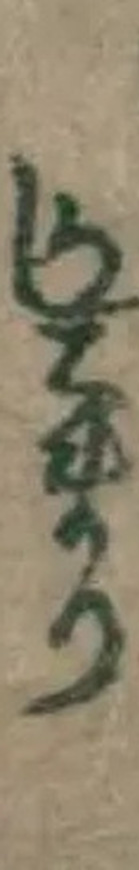かしこまり
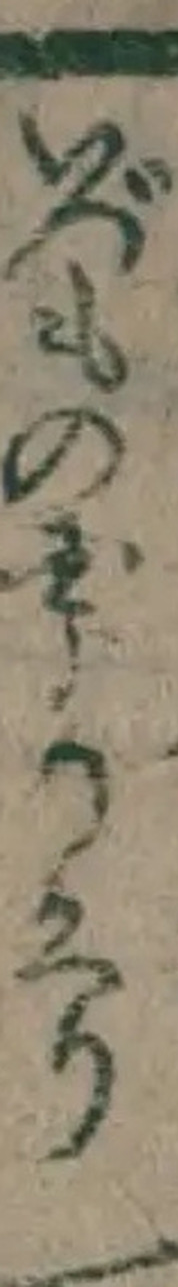いづもの国よりかへり
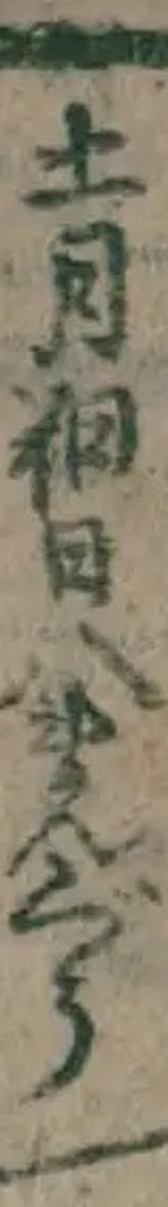十一月朔日八まんぐう
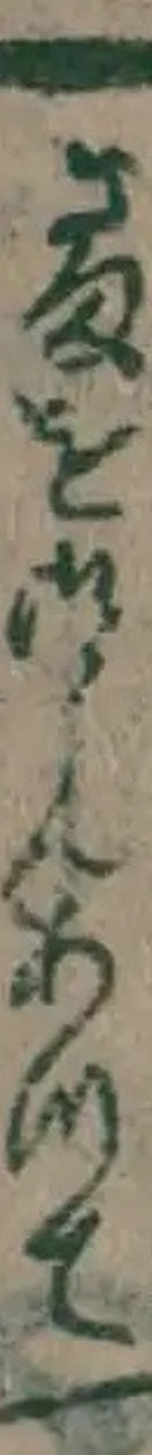さまを御らんあつて
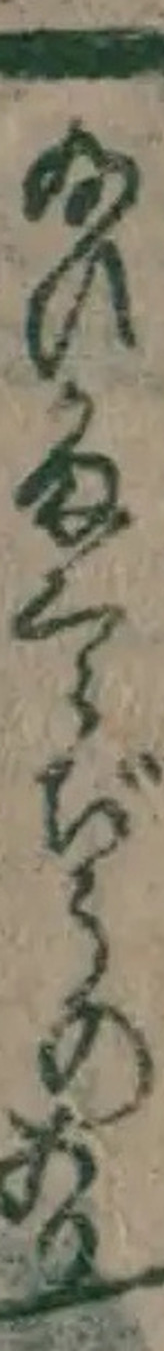給ひかまくらぢうのあり
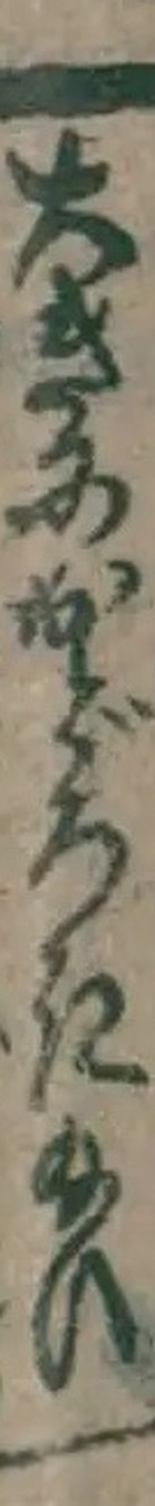大きにおどろき給ひ
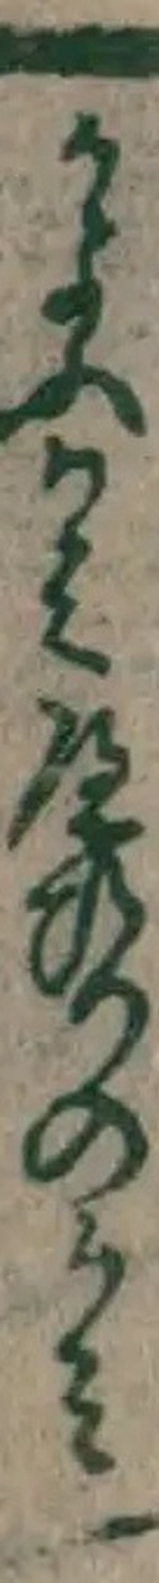かよふかみ屁ひりのかみ
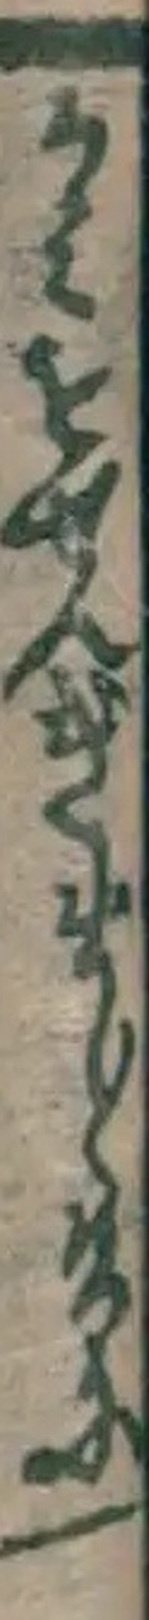かみをせんぎまし〳〵けるに
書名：頓作時雨月 3巻
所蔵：国立国会図書館 National Diet Library, JAPAN
